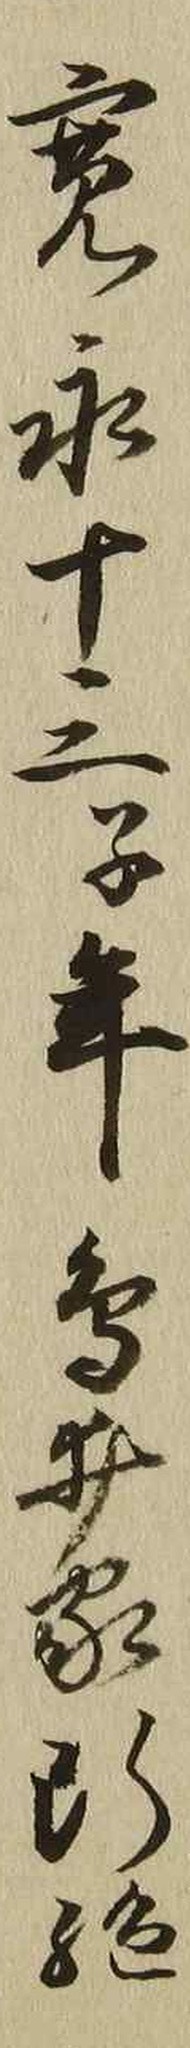寛永十三子年鳥井家断絶
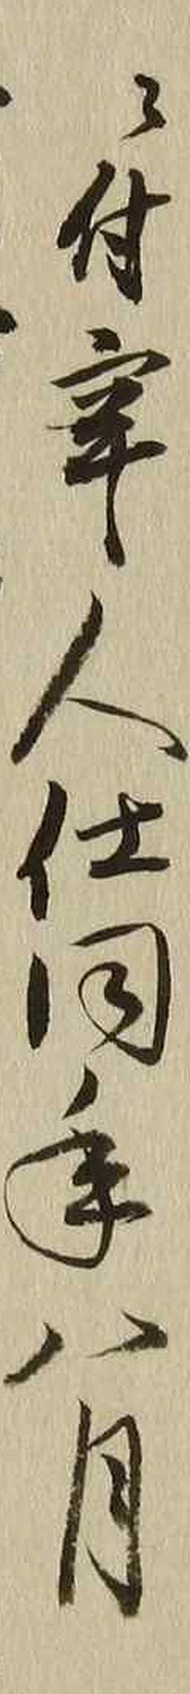ニ付牢人仕同年八月
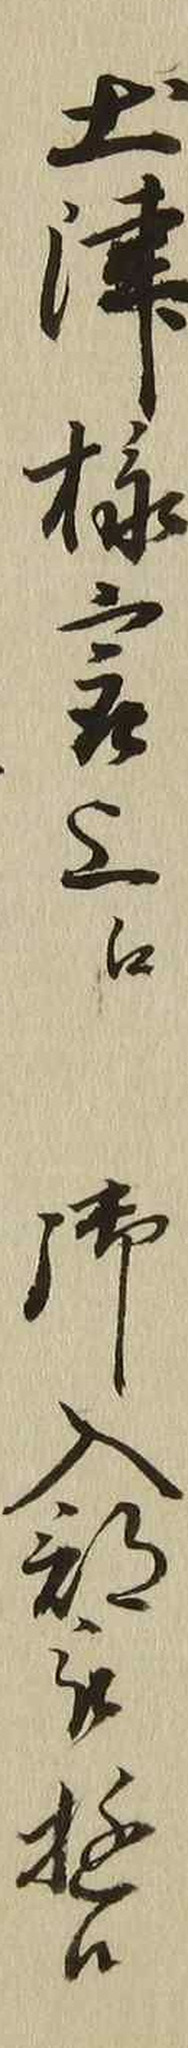土津様最上江御入部被遊候
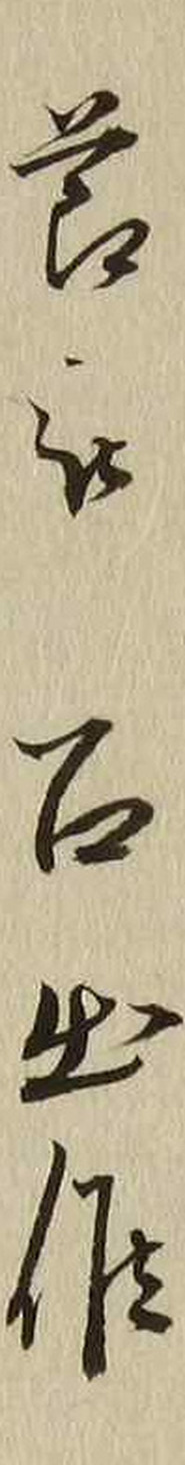節被召出候
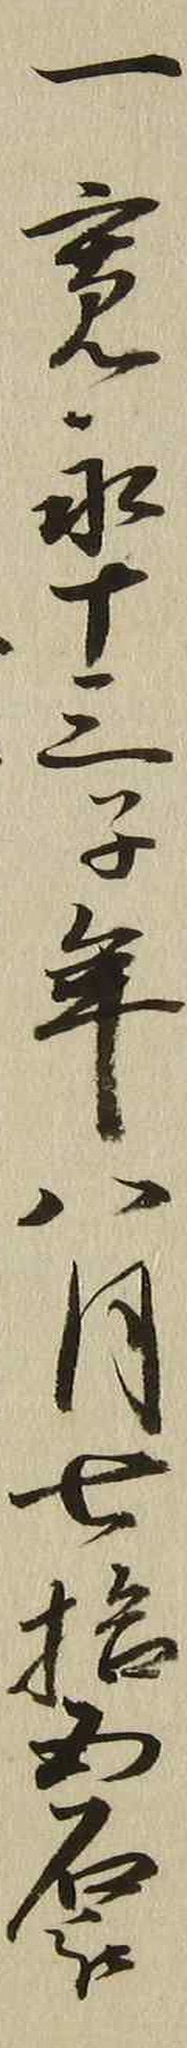一寛永十三子年八月七拾五石被
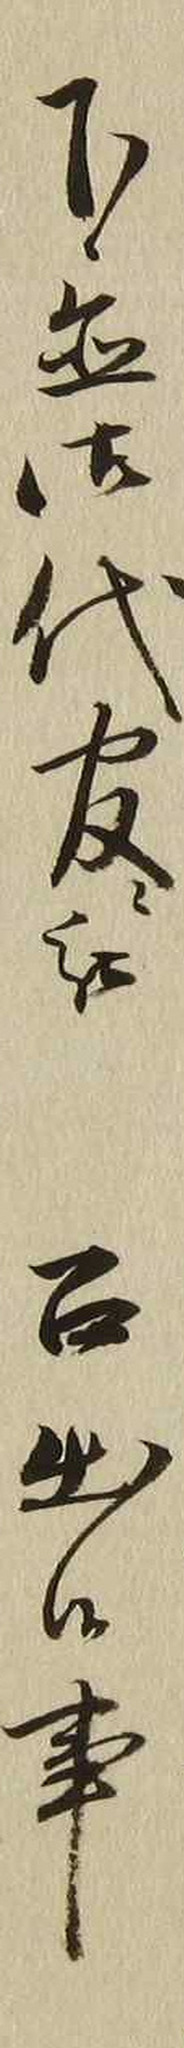下置御代官ニ被召出候事
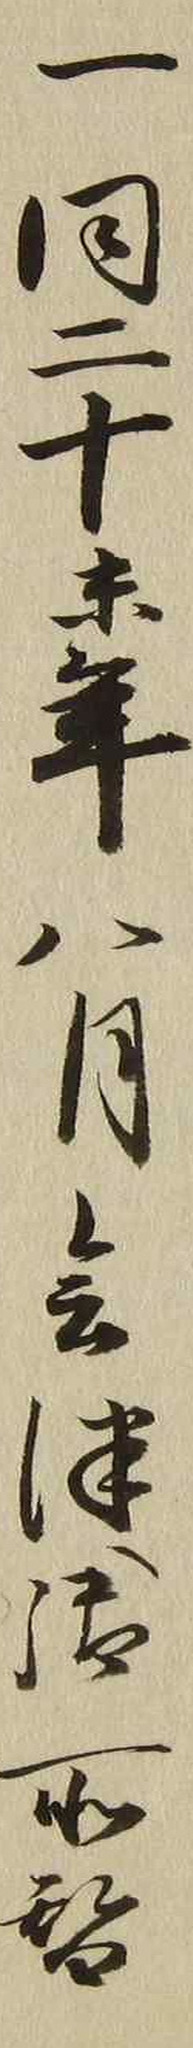一同二十未年八月会津へ御所替
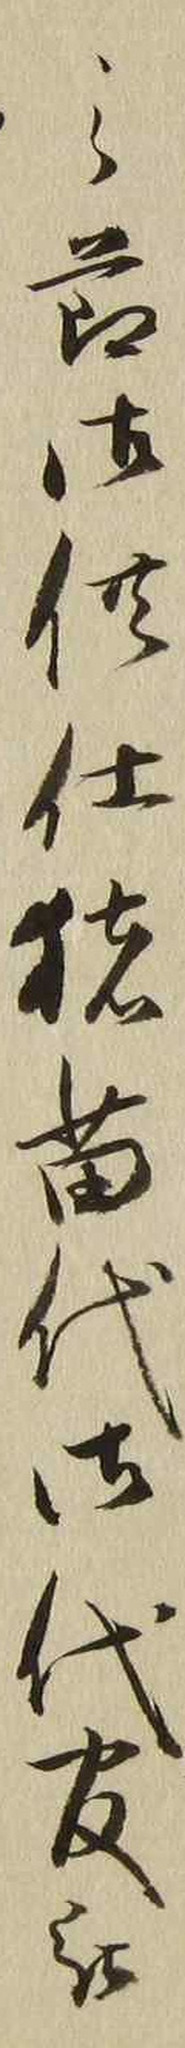之節御供仕猪苗代御代官被
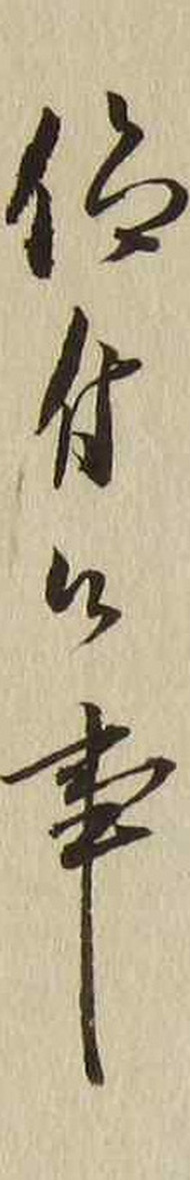仰付候事
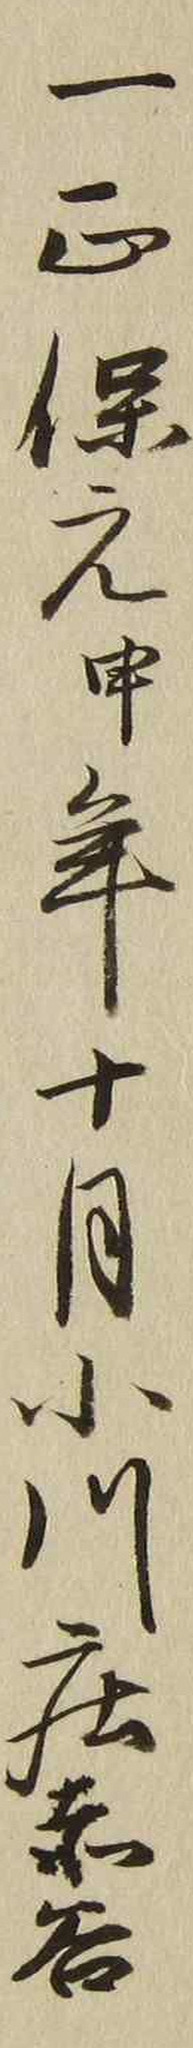一正保元申年十月小川庄赤谷
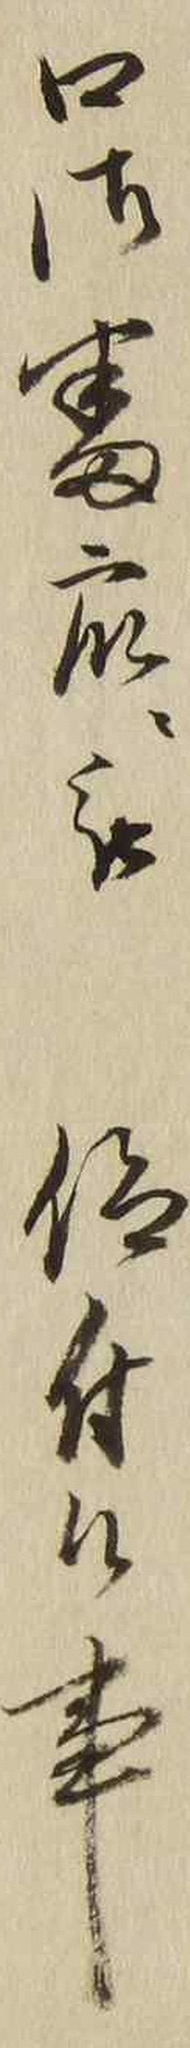口御番衆ニ被仰付候事
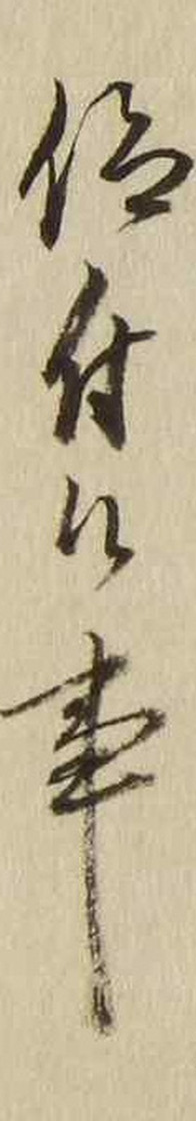仰付候事

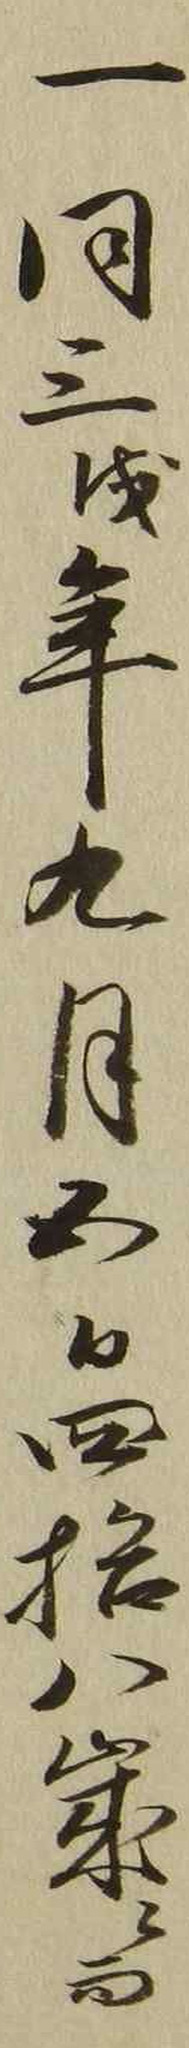一同三戌年九月五日四拾八歳ニ而
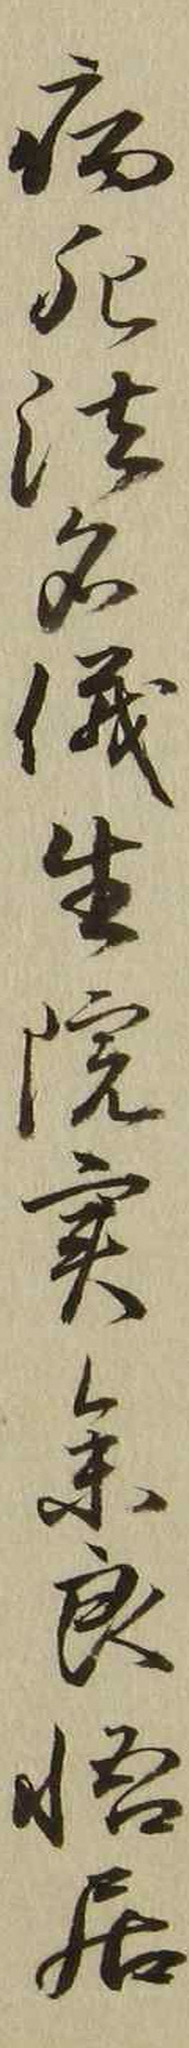病死法名儀生院実参良悟居
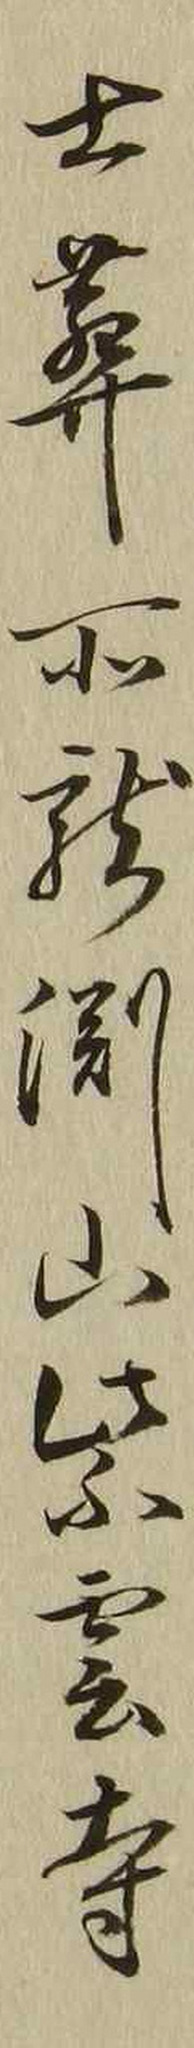士葬所龍淵山紫雲寺
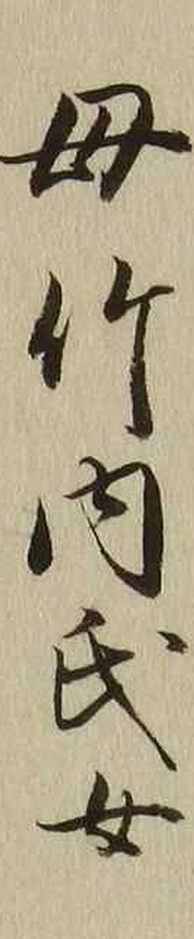母竹内氏女
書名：諸士系譜　巻之61　と之部4
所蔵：会津若松市立会津図書館
